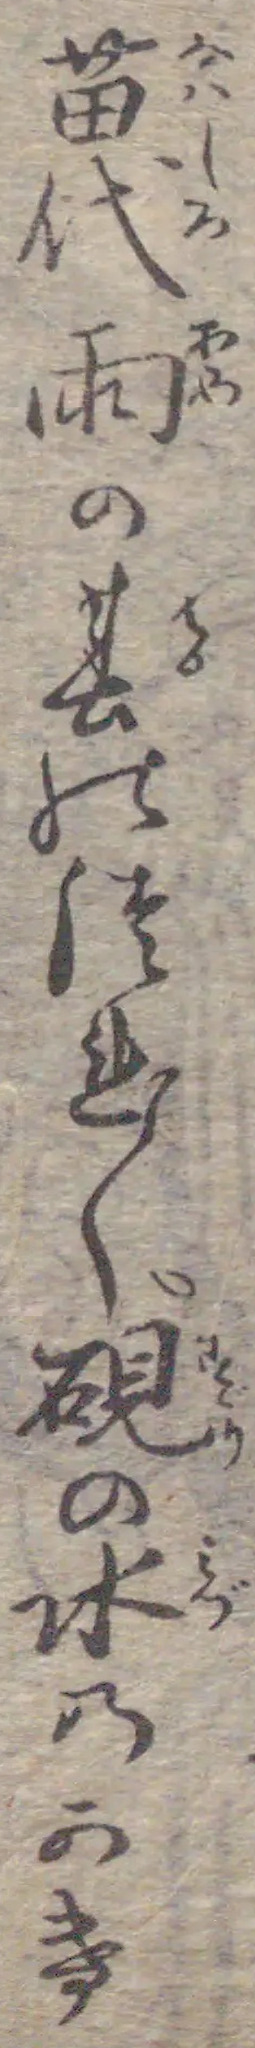苗代雨の春のつれ〳〵。硯の水のかけ
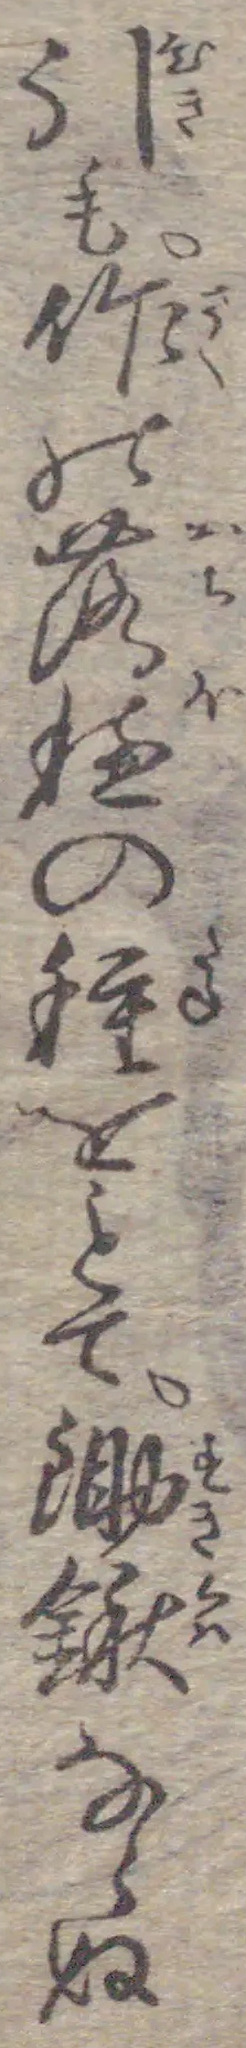引も。作の落穂の種をもて。鋤鍬ならぬ
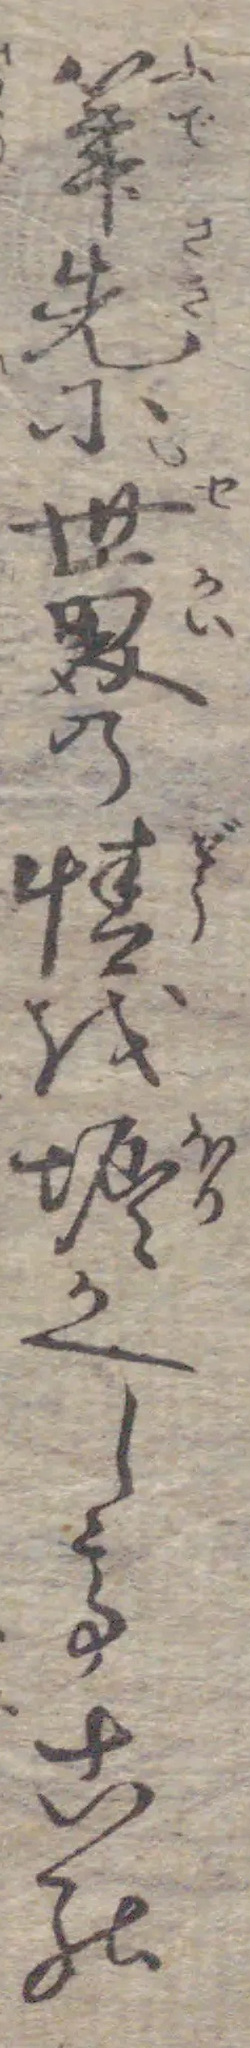筆先に。世界の情を堀かへしてこの
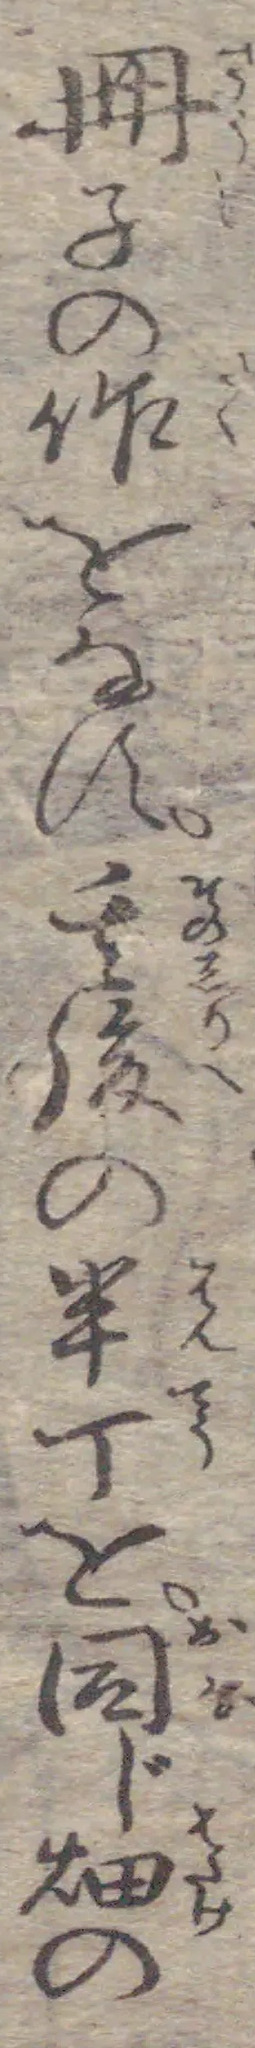冊子の作をなす。其後の半丁を。同じ畑の
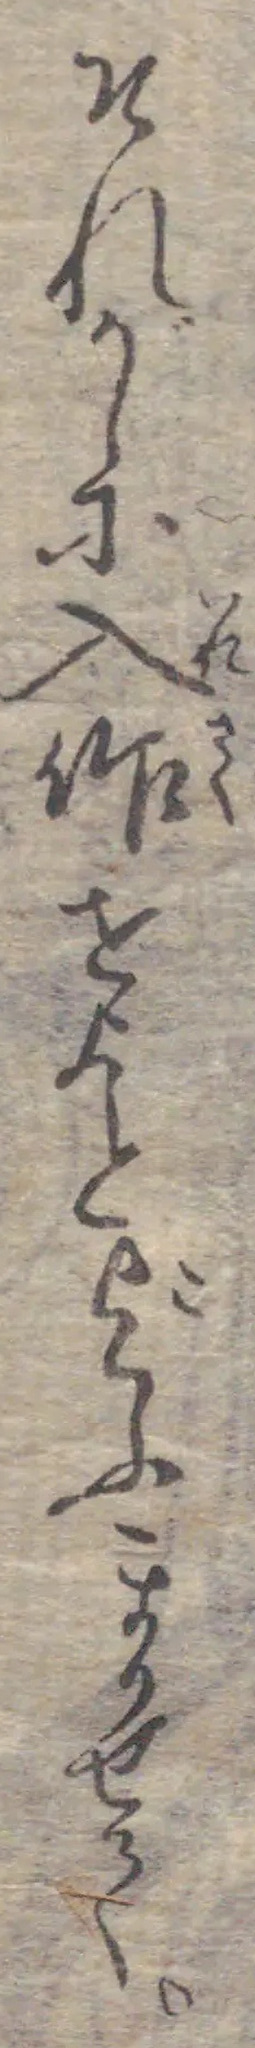それがしに入作せよと乞ふまかせて。
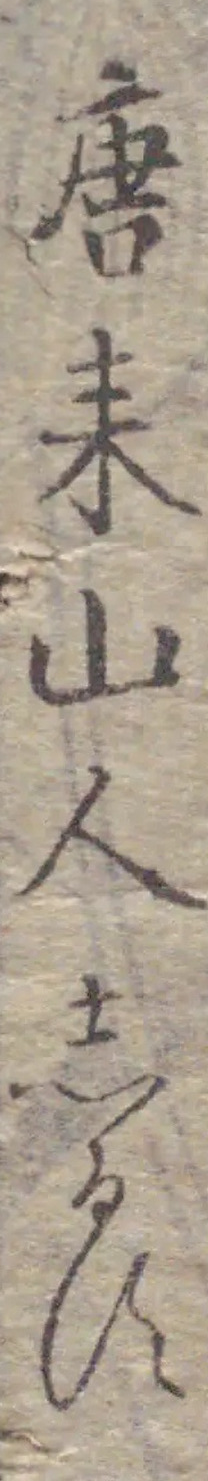唐来山人しるす
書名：福壽海旡量品玉 3巻
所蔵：国立国会図書館 National Diet Library, JAPAN
